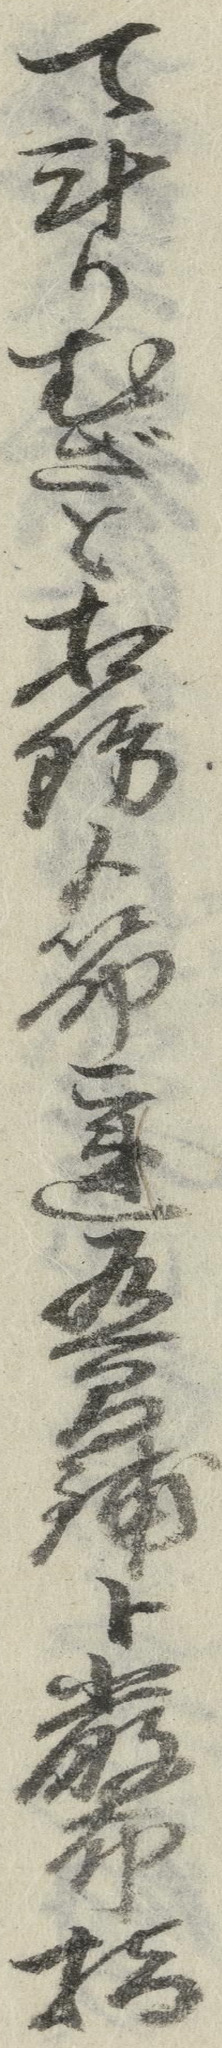て計りむざと相防候筋これ有間鋪ト厳布指
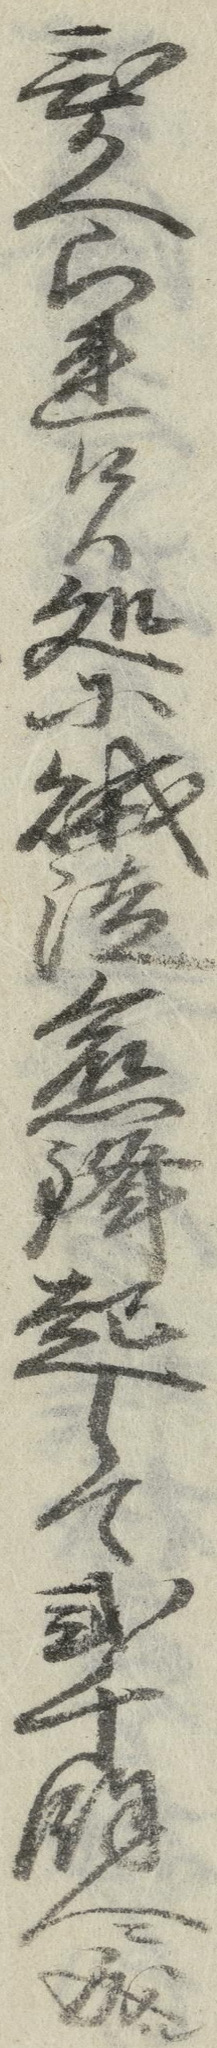ひかへられける処に賊徒愈蜂起して弐千餘人に成
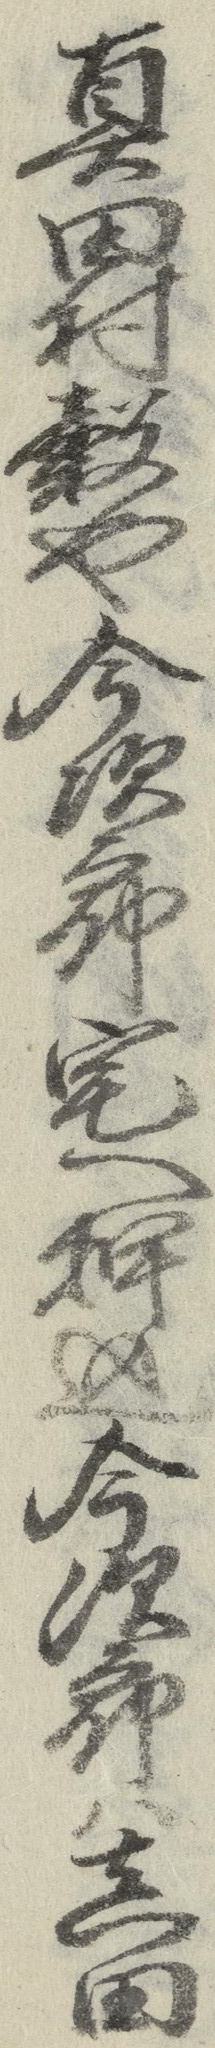真田村穀や今次郎宅へ押込今次郎は真田
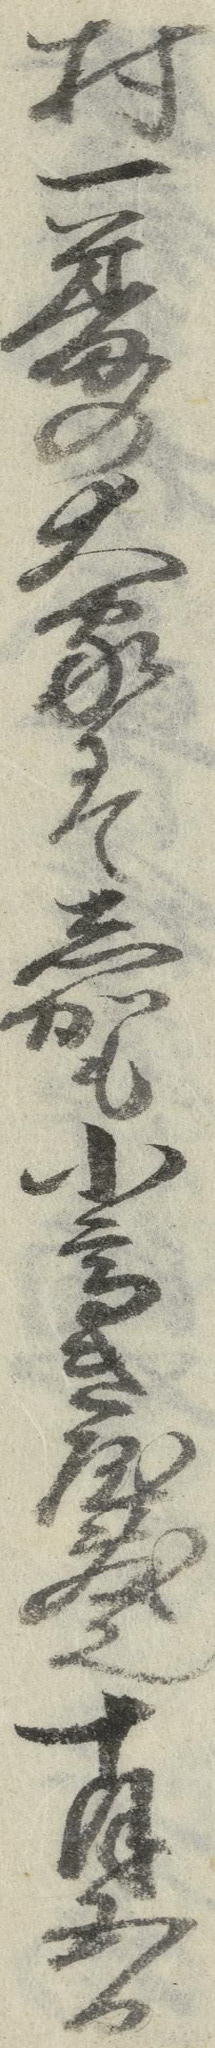村一番の大家にてしかも小高き屋敷也十月五日
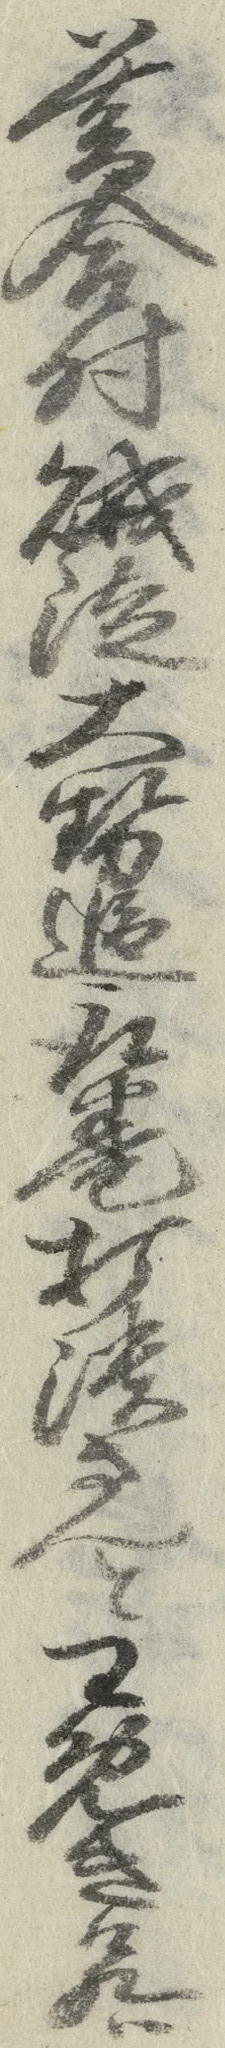暮合時賊徒大勢追取巻打潰さんとわめきけれは
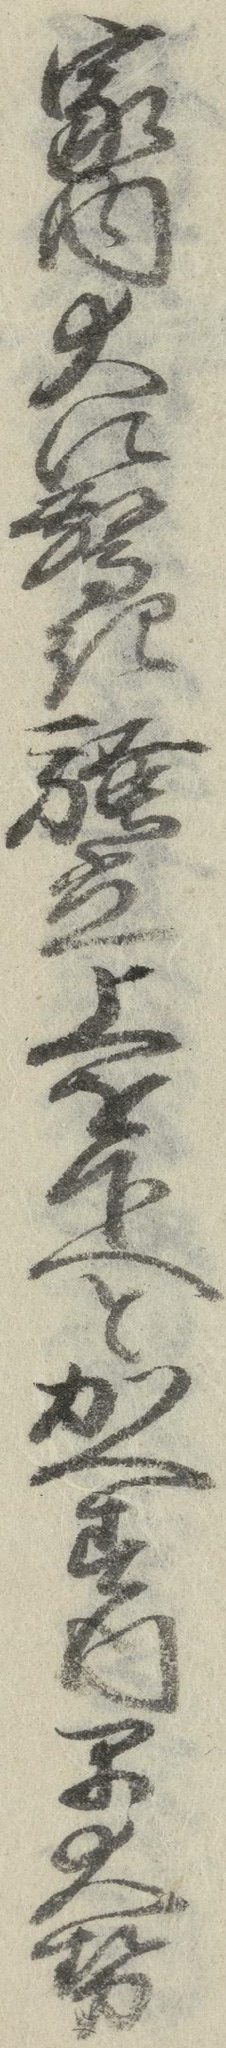家内大に驚き騒立上を下へとかへす内早大勢

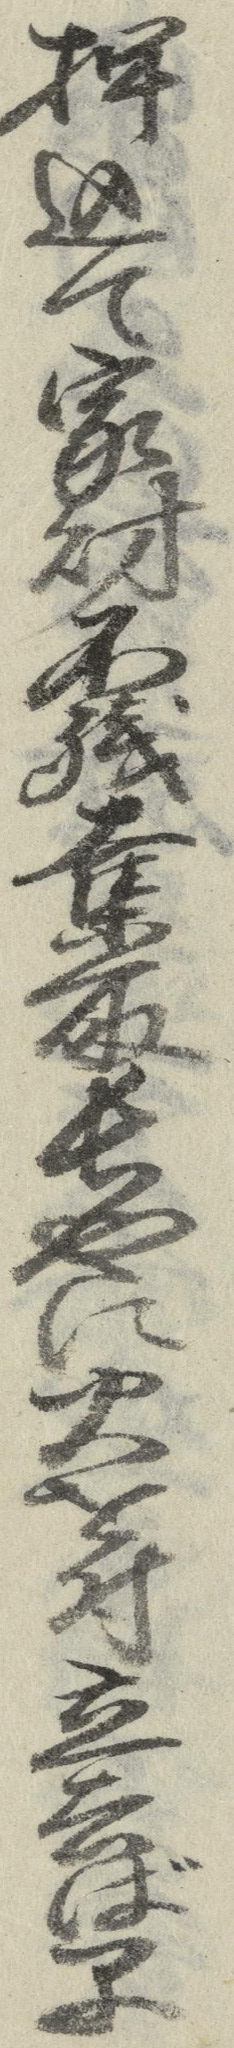押込て家財不残奪取長やに火を付立去ば早
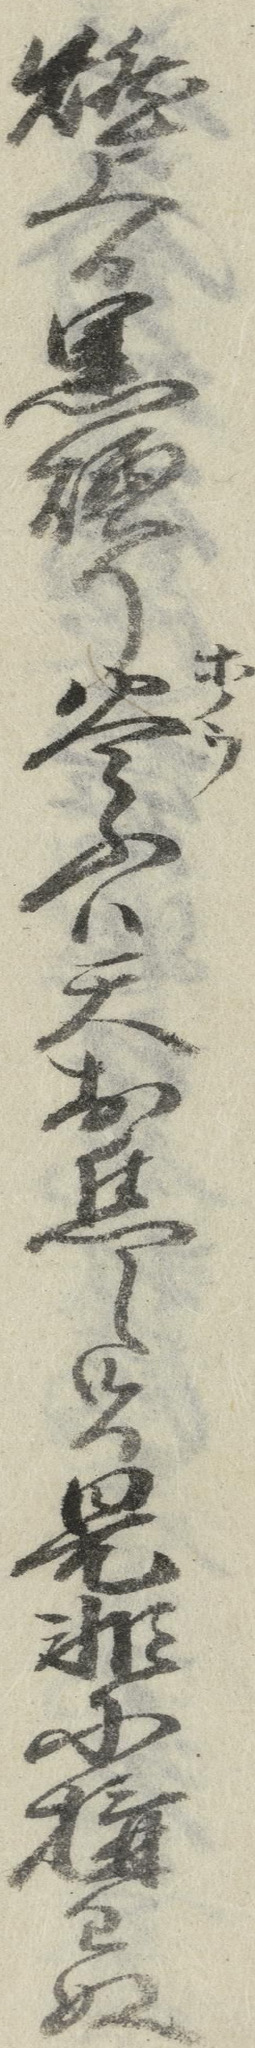燃上る黒煙り炎ふは天お焦しける是非に構わぬ
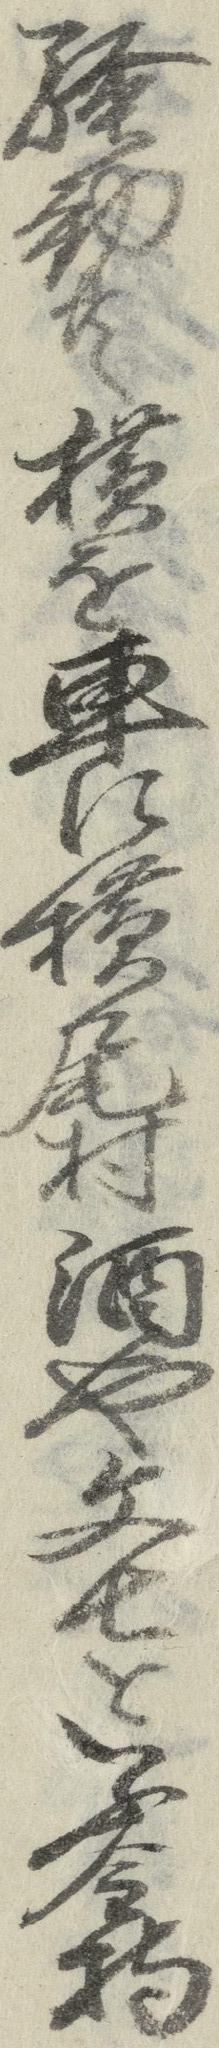騒動共横を車に横尾村酒や文七といふ金持
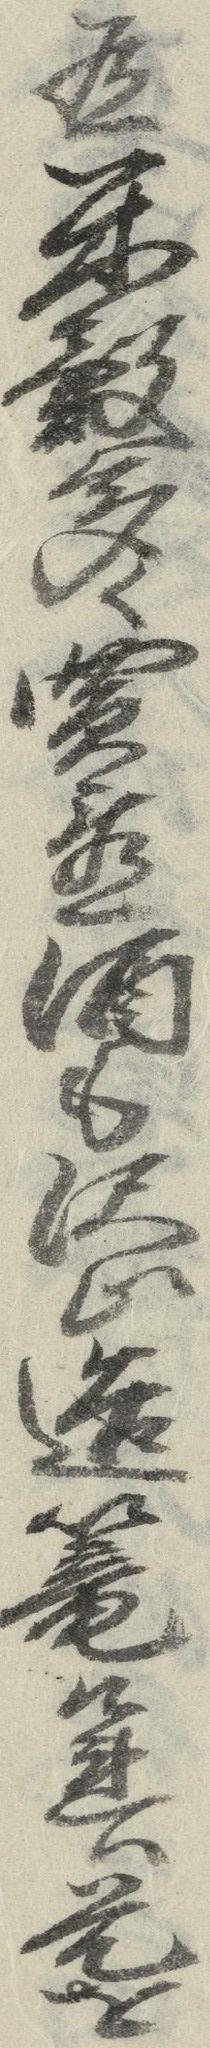有米穀多く買置酒も沢山造篭けれは是を
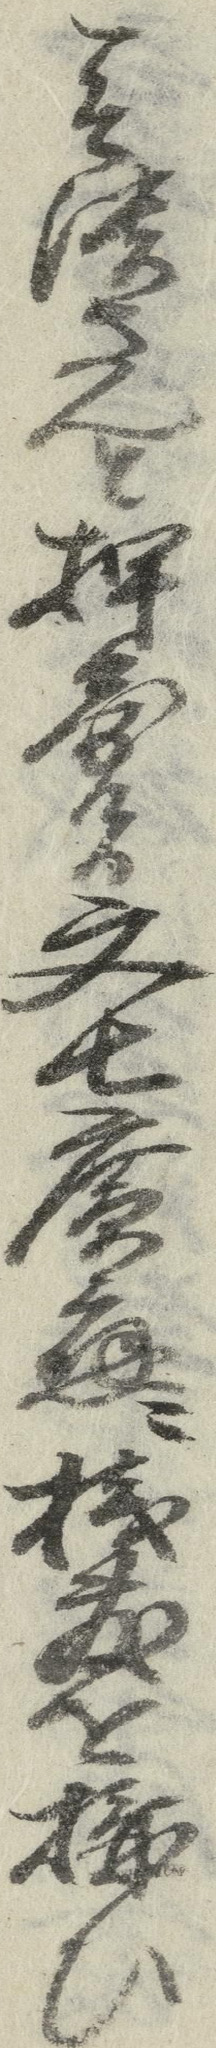こそ潰さんと押寄ける文七廣庭に桟敷を構ひ
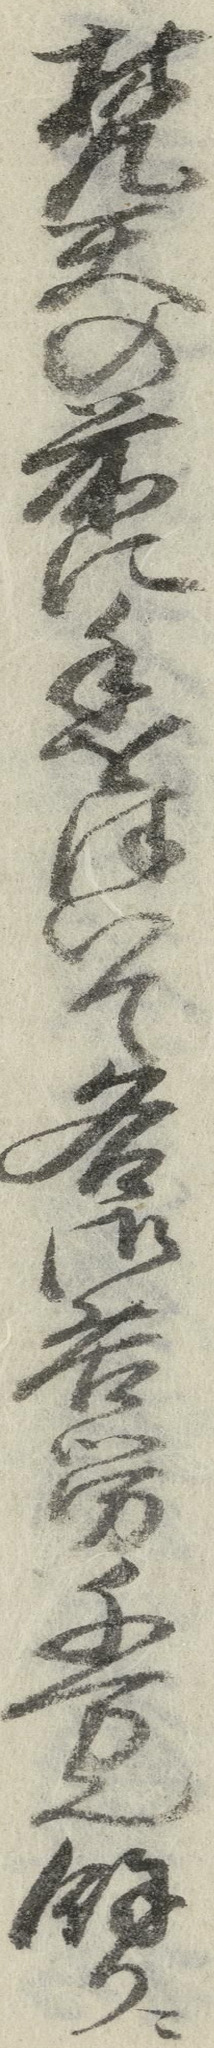梵天の前に手を付いて各御苦労千万也餘りに
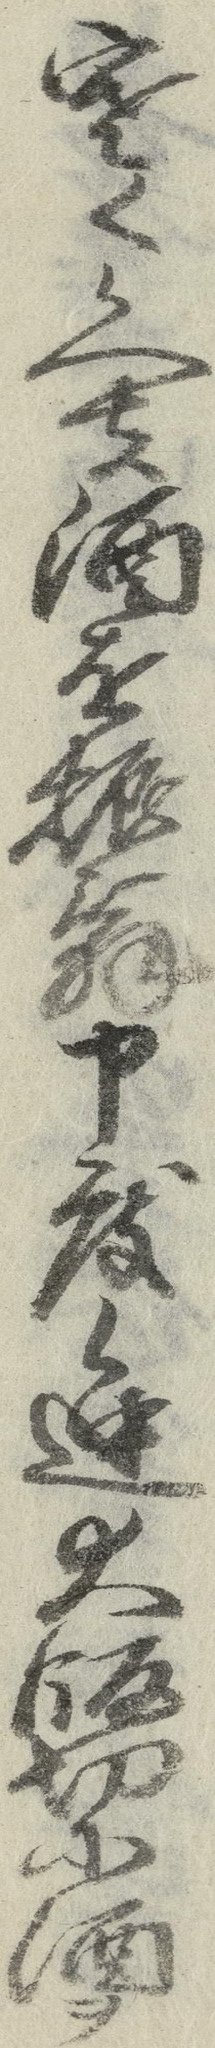寒く候へ者酒を振舞申度候迚大飯切に酒ヲ
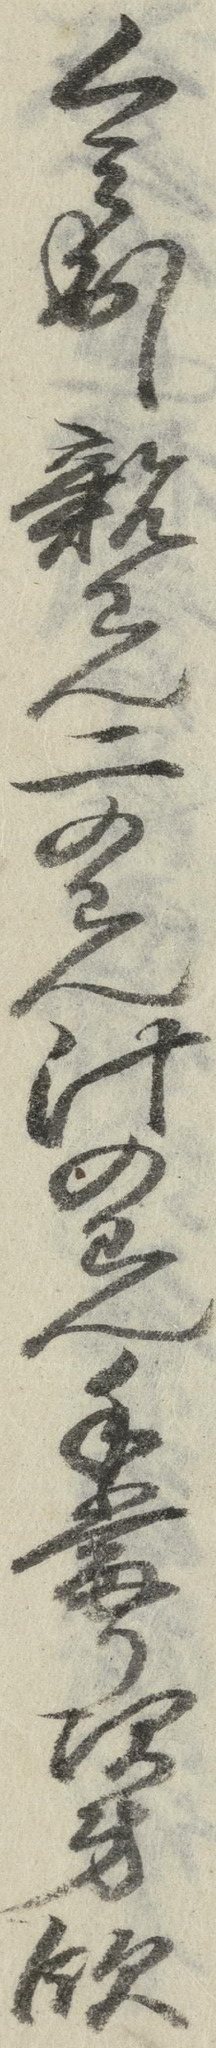くみ出し親わん二のわん汁のわん手當り次第飲
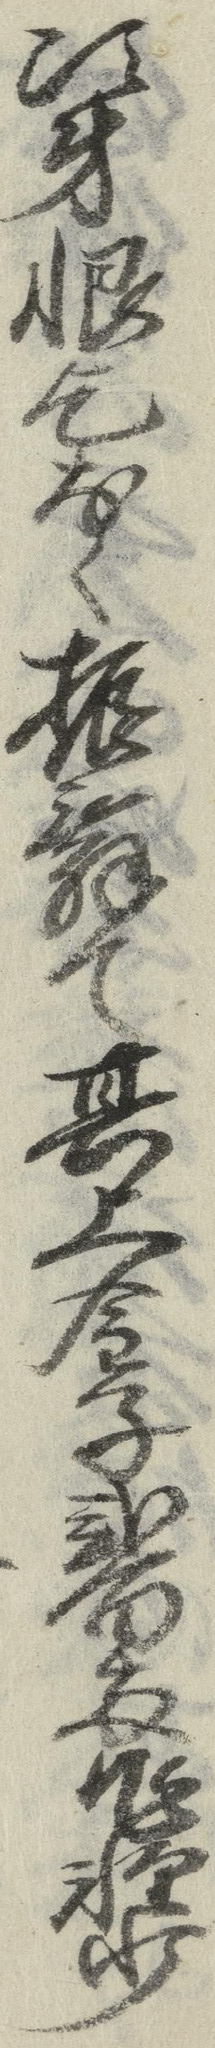次第恨乞なく振舞て其上金子弐百両乍軽少
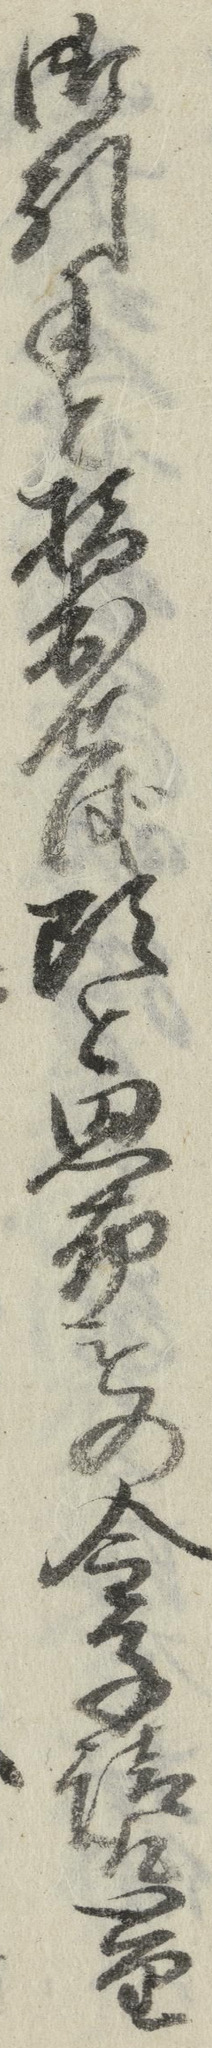御引手と指出せば頭と思布もの金子請取とり
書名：浅間大焼騒動記　下
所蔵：東京大学地震研究所図書室 Earthquake Research Institute Library, The University of Tokyo, JAPAN
